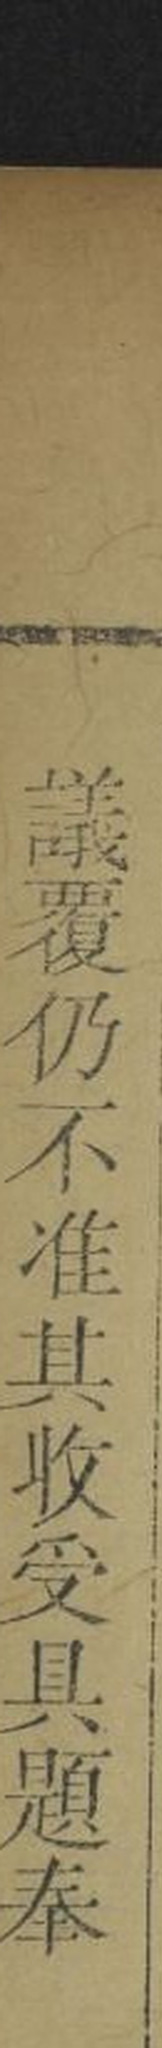議覆仍不准其收受具題奉
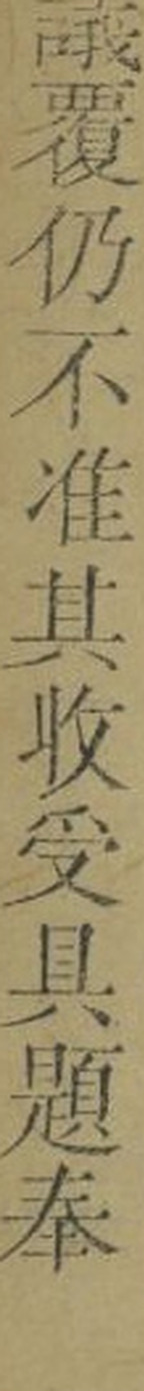議覆仍不准其收受具題奉

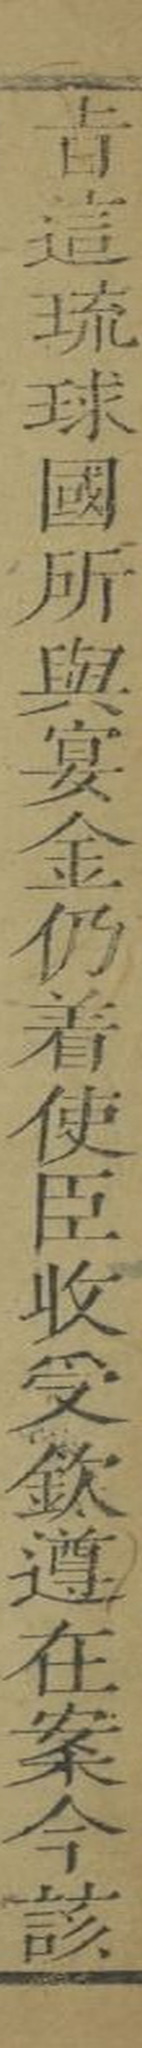㫖這琉球國所與宴金仍着使臣收受欽遵在案今該
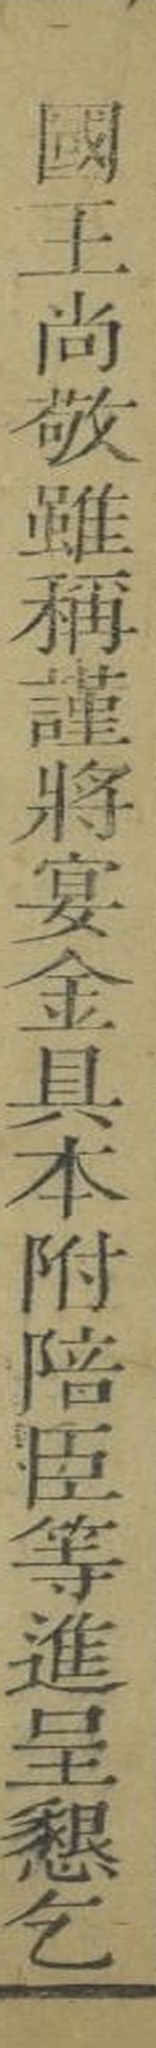國王尚敬雖稱謹將宴金具本附陪臣等進呈懇乞
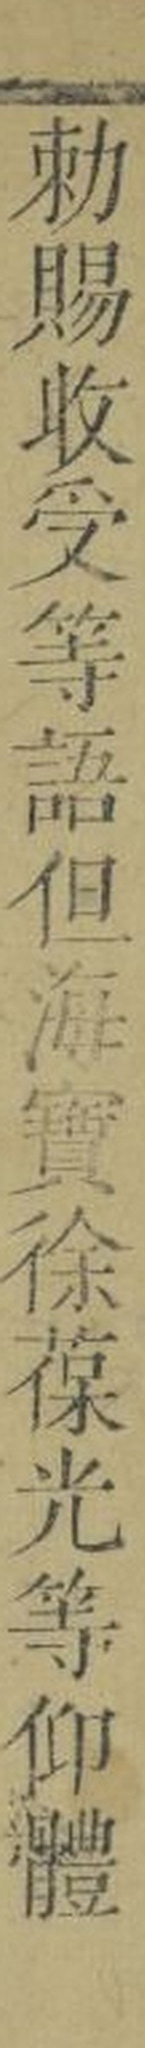勅賜收受等語但海寶徐葆光等仰體
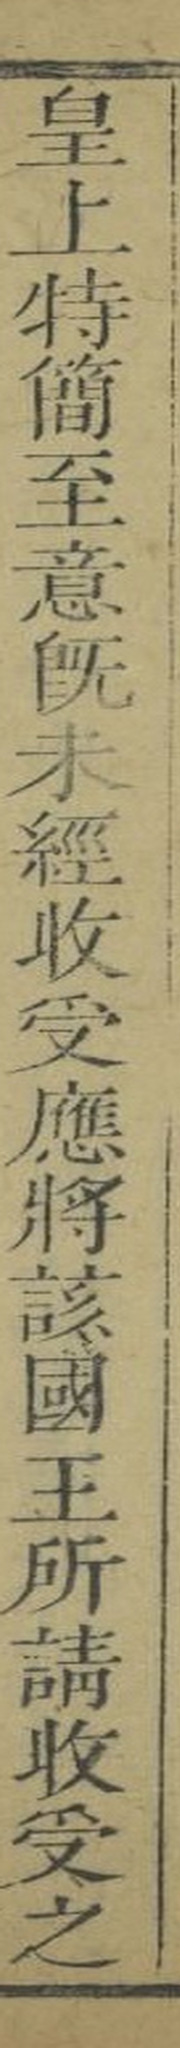皇上特簡至意既未經收受應將該國王所請收受之
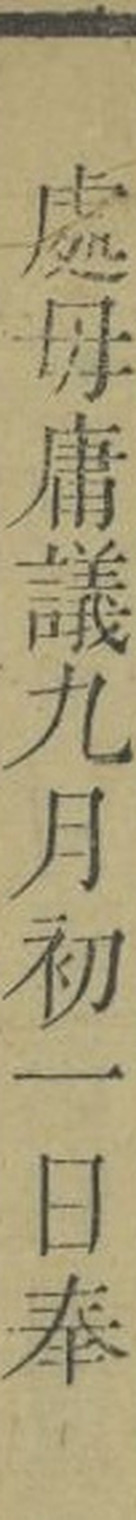處母庸議九月初一日奉
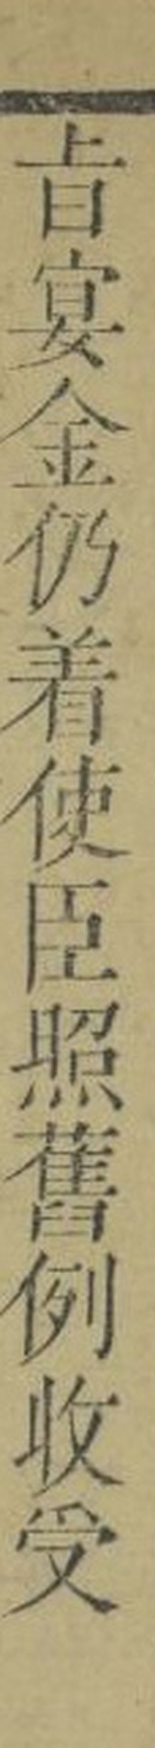㫖宴金仍着使臣照舊例收受
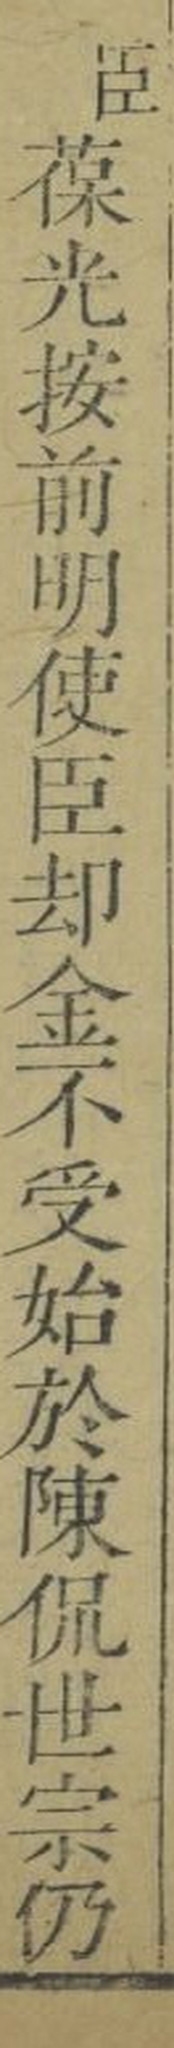臣葆光按前明使臣却金不受始於陳侃世宗仍
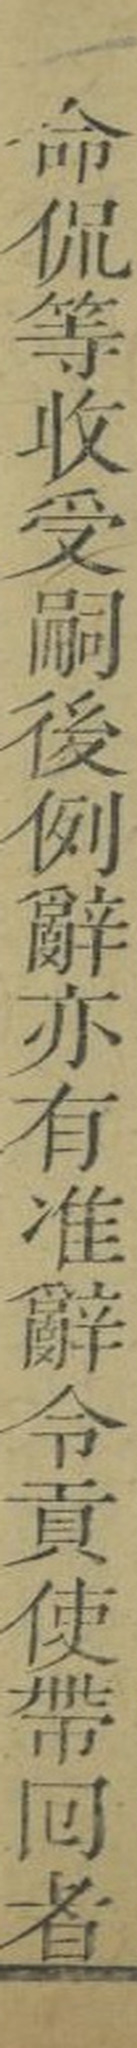命侃等收受嗣後例辭亦有准辭令貢使帶囘者
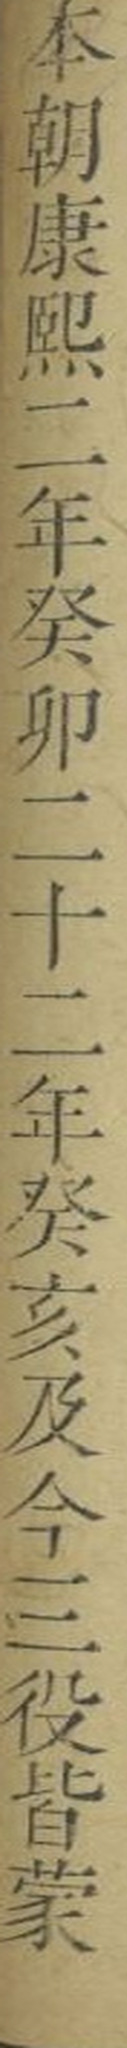本朝康熙二年癸卯二十二年癸亥及今三役皆蒙
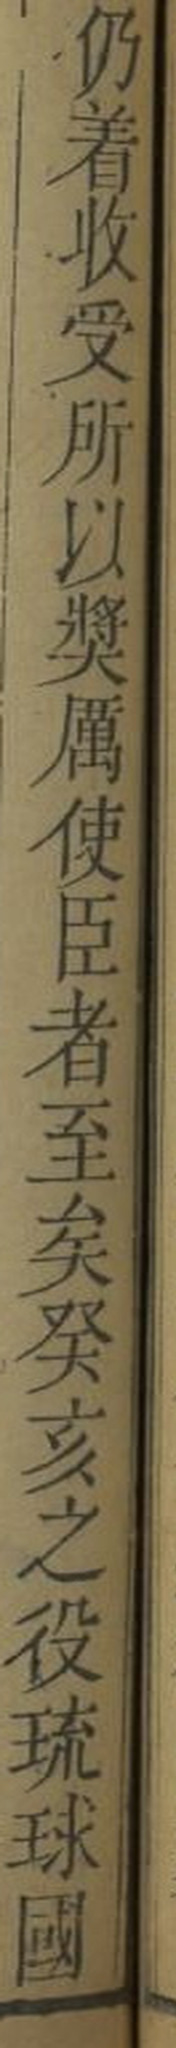恩仍着收受所以奬厲使臣者至矣癸亥之役琉球國
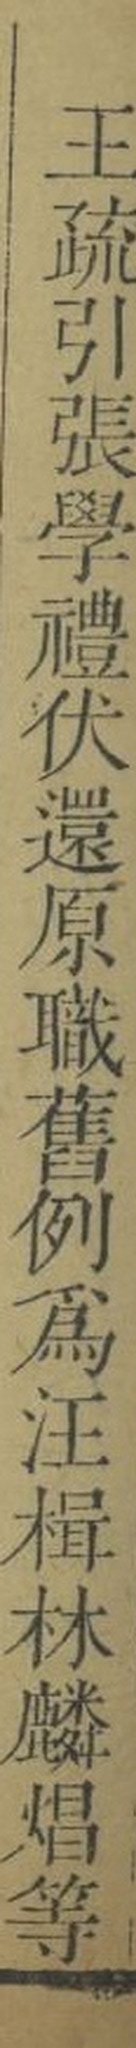王疏引張學禮伏還原職舊例爲汪楫林麟焻等
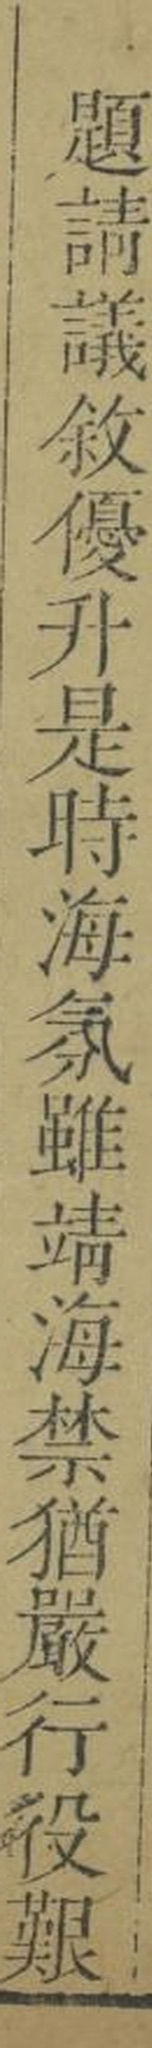題請議敘優升是時海氛雖靖海禁猶嚴行役艱
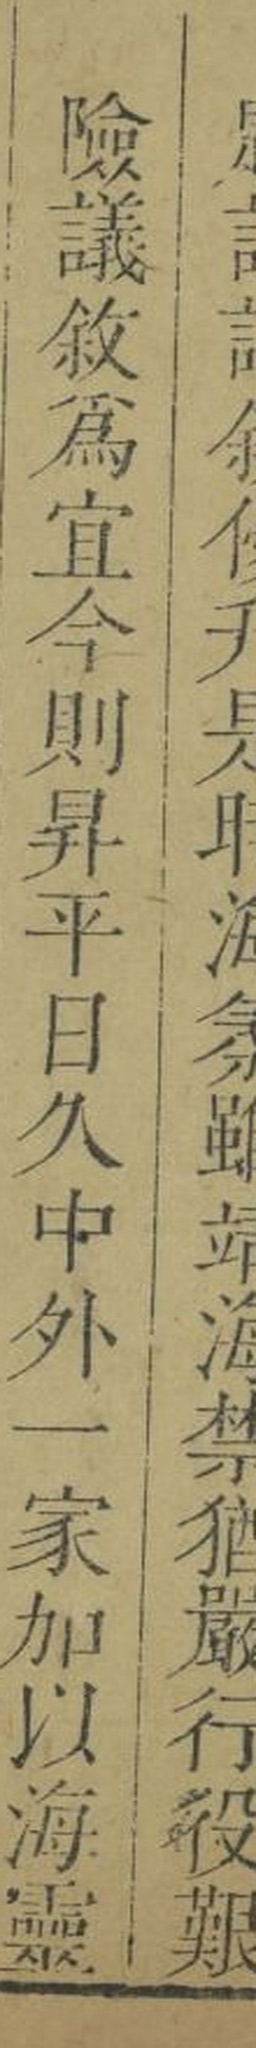險議敘爲宜今則昇平日久中外一家加以海靈
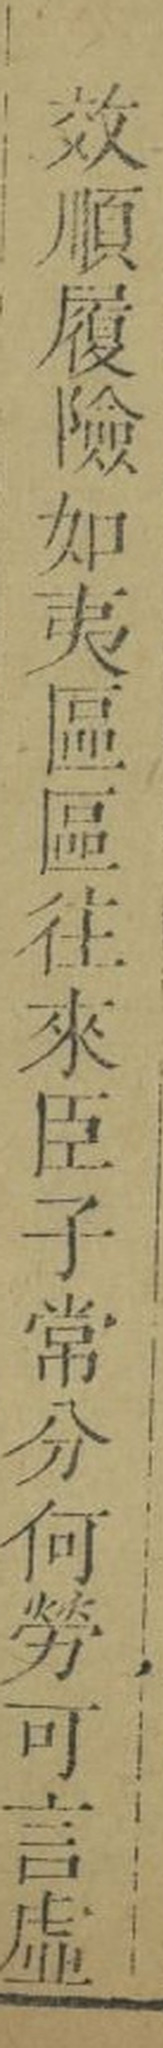效順履險如夷區區往來臣子常分何勞可言虛
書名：中山伝信録 巻二
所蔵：University of the Ryukyus Library
